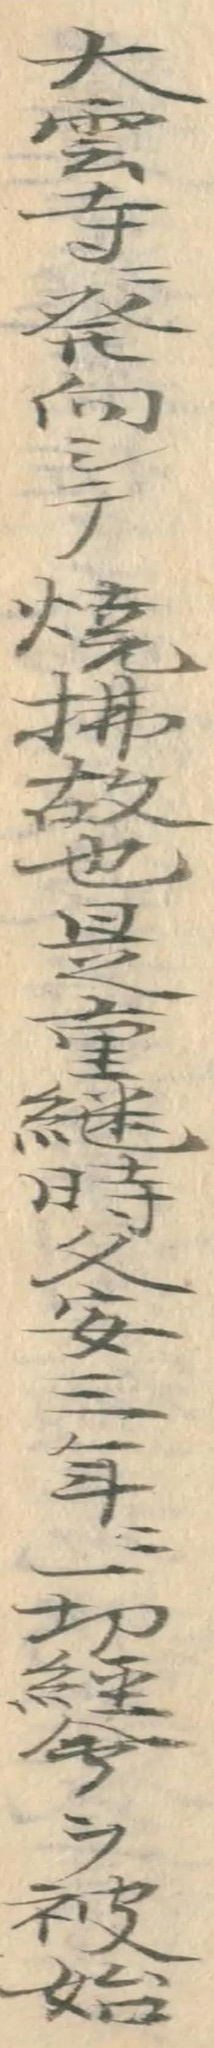大雲寺ニ発向シテ焼払故也是重継時久安三年ニ一切経会ヲ被始

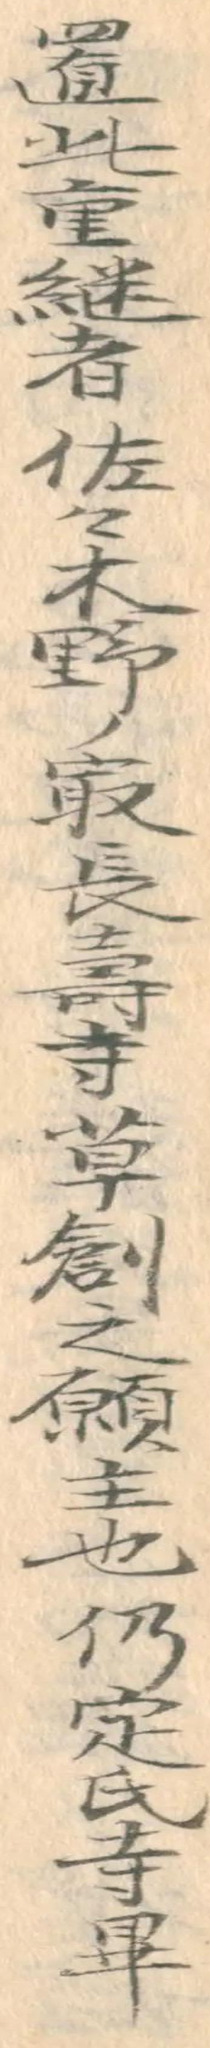置此重継者佐々木野ノ最長寿寺草創之願主也仍定氏寺畢
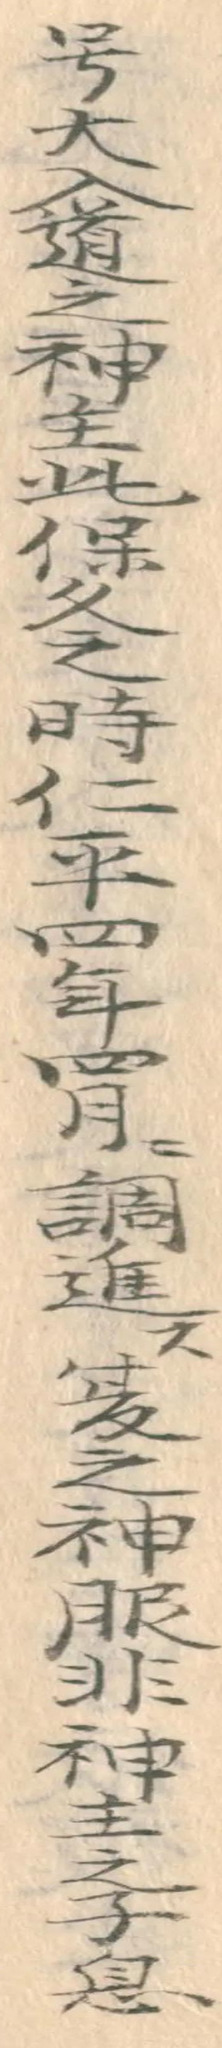号大入道之神主此保久之時仁平四年四月ニ調進ス夏之神服非神主之子息
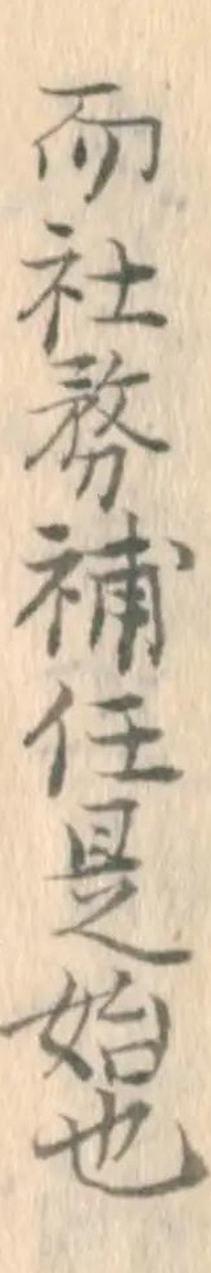而社務補任是始也
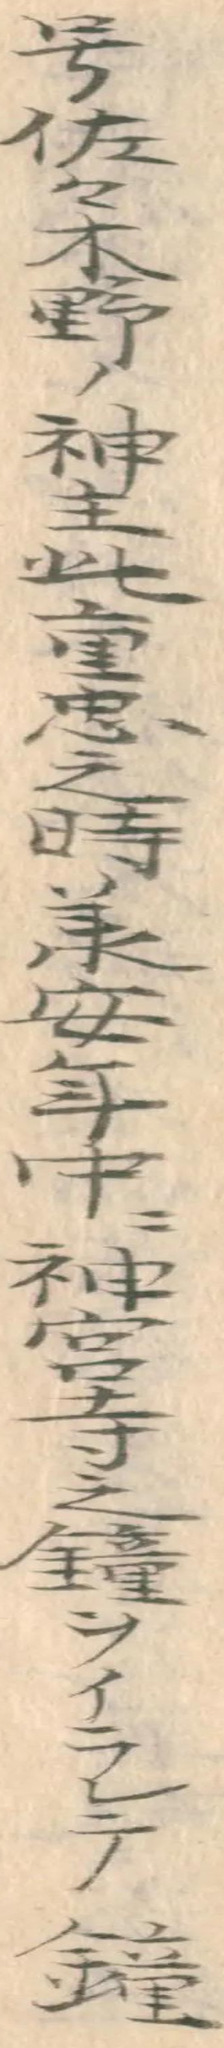号佐々木野ノ神主此重忠之時承安年中ニ神宮寺之鐘ヲイラレテ鐘
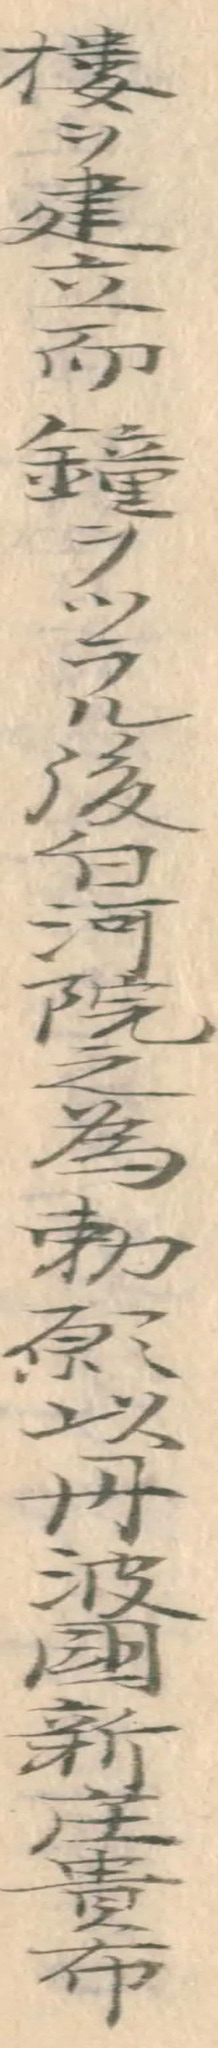楼ヲ建立而鐘ヲツラル後白河院之為勅願以丹波国新庄貴布
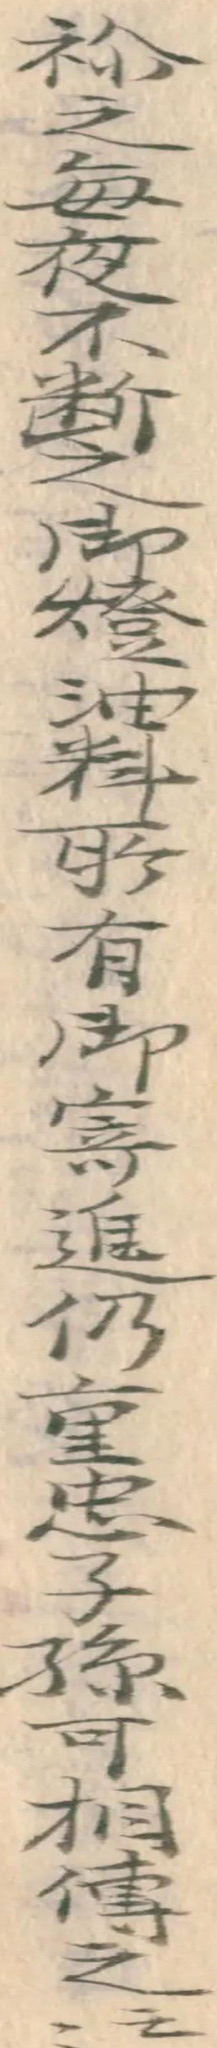祢之毎夜不断之御燈油料所有御寄進仍重忠子孫可相伝之云々
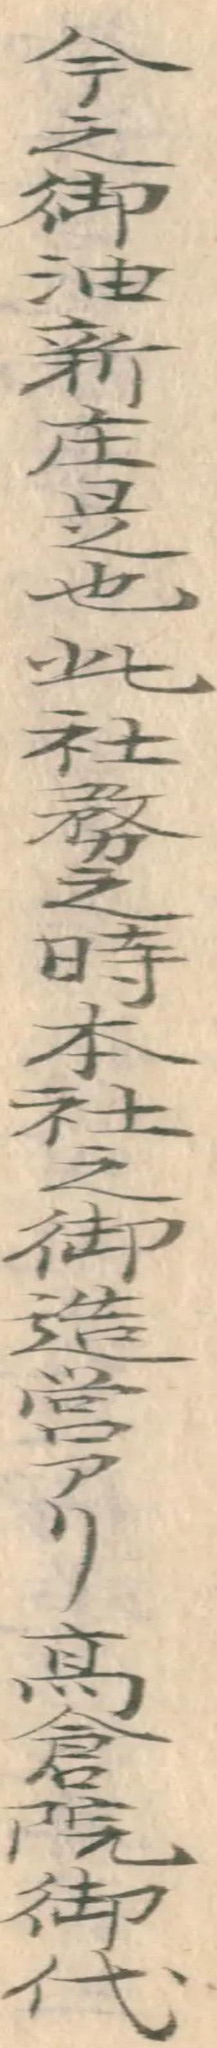今之御油新庄是也此社務之時本社之御造営アリ高倉院御代
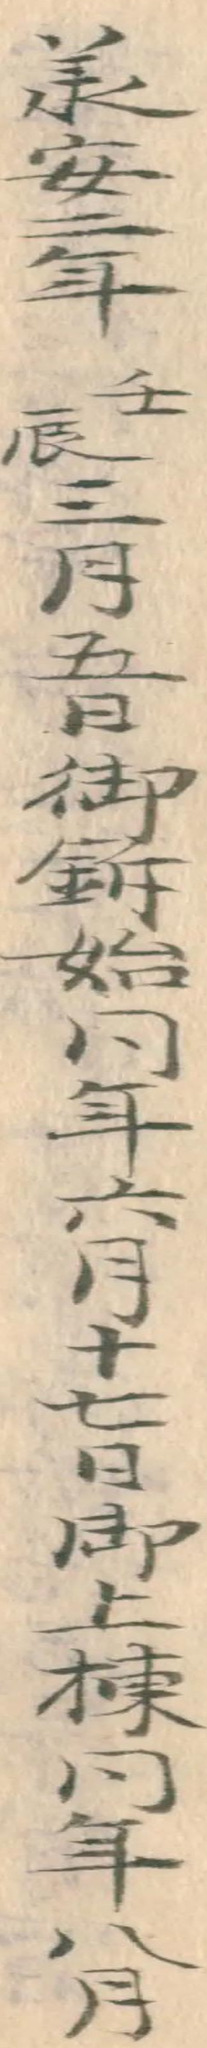承安二年壬辰三月五日御釿始同年六月十七日御上棟同年八月
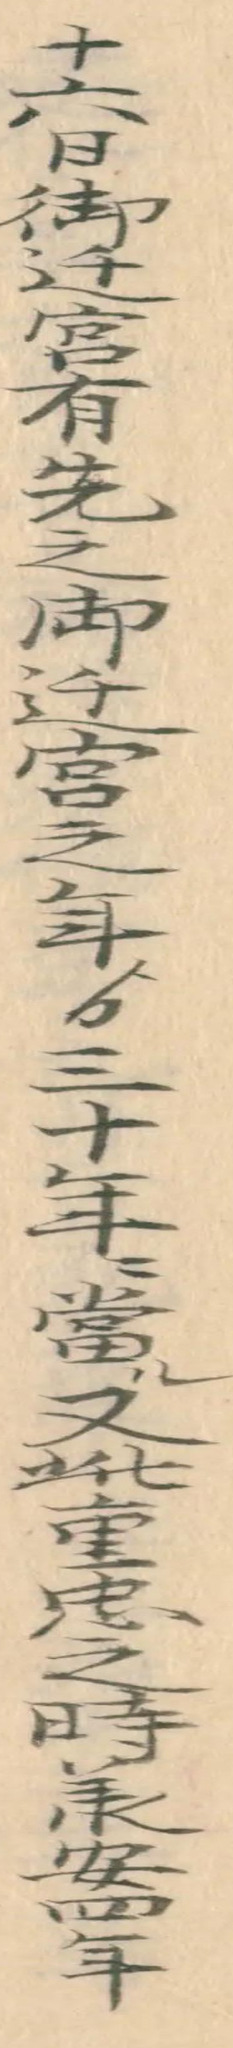十六日御遷宮有先之御遷宮之年ゟ三十年ニ当ル又此重忠之時承安四年
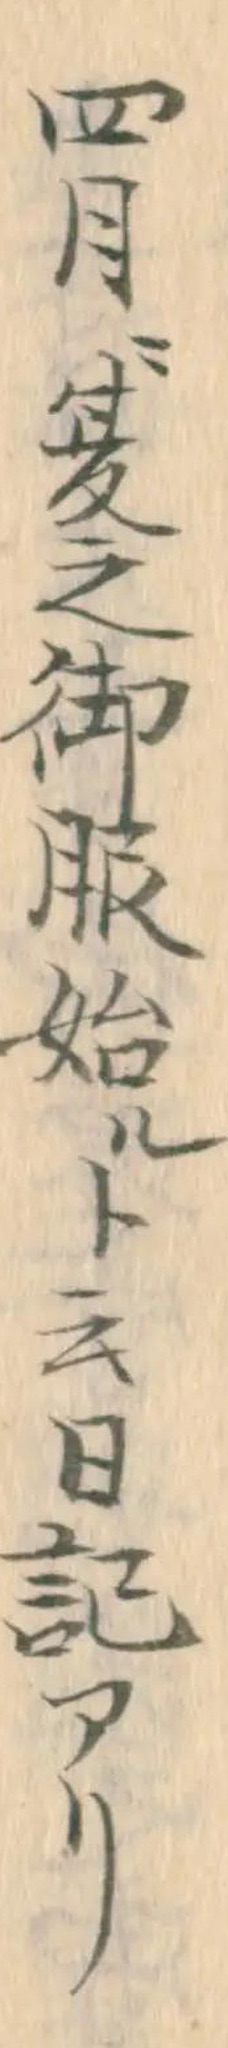四月ニ夏之御服始ルト云日記アリ
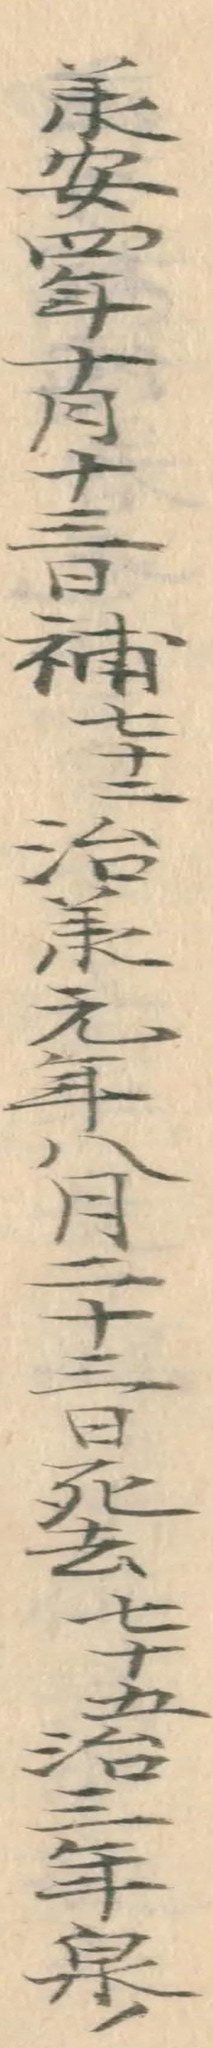家平承安四年十月十三日補七十二治承元年八月二十三日死去七十五治三年泉ノ
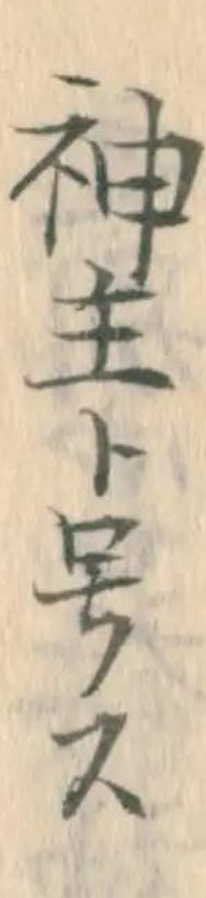神主ト号ス
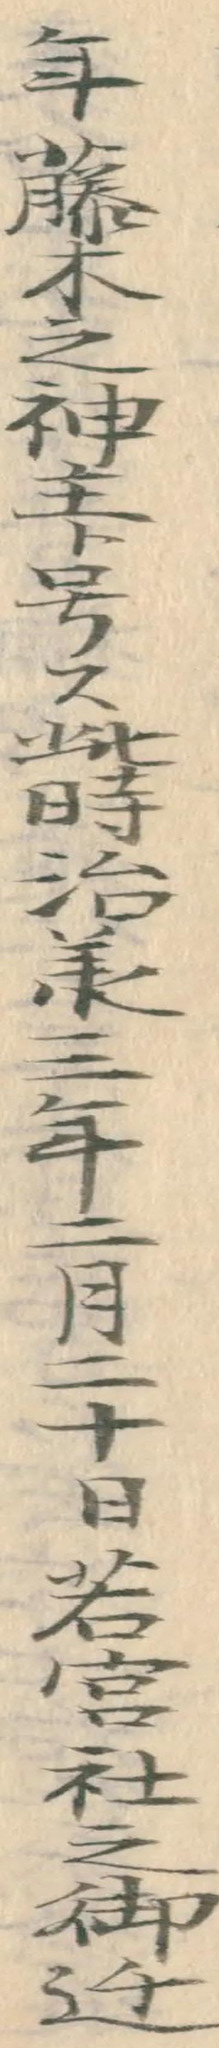歌人年藤木之神主ト号ス此時治承三年二月二十日若宮社之御遷
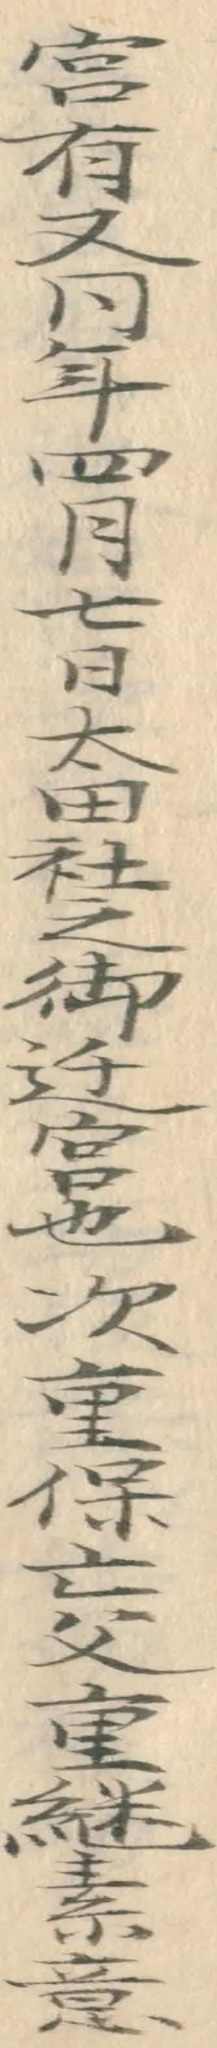宮有又同年四月七日太田社之御遷宮也次重保亡父重継素意
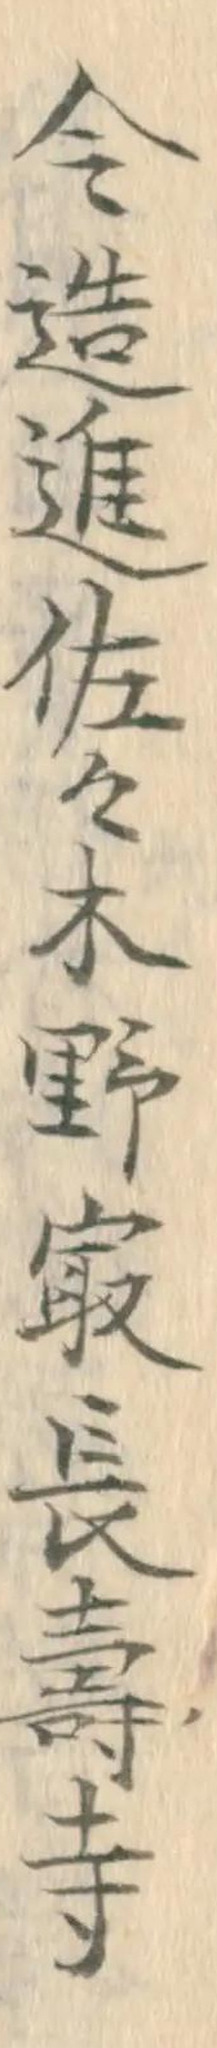令造進佐々木野最長寿寺
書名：賀茂社記録. 第24冊
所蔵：国立国会図書館 National Diet Library, JAPAN
